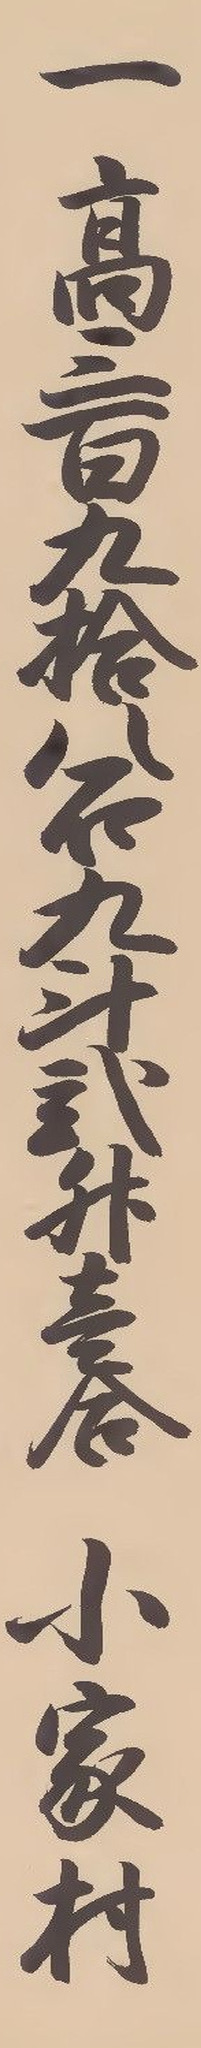一高三百九拾八石九斗弐升壱合小家村
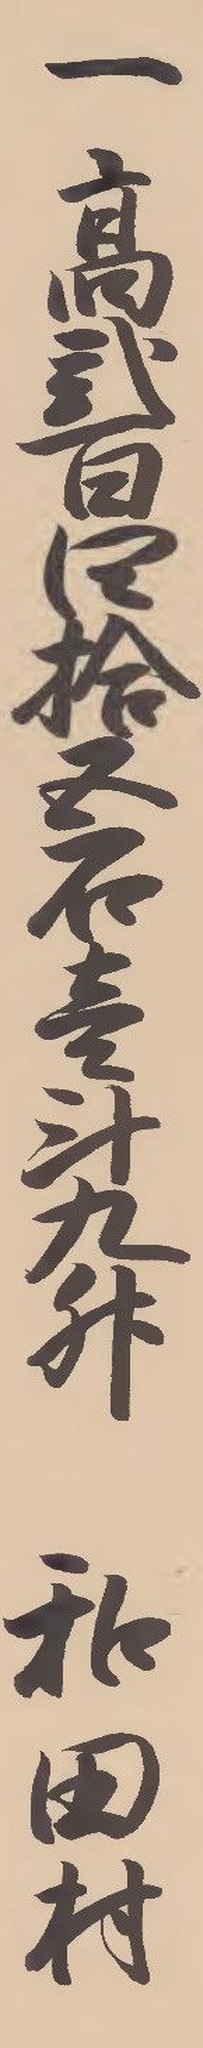一高弐百四拾五石壱斗九升和田村
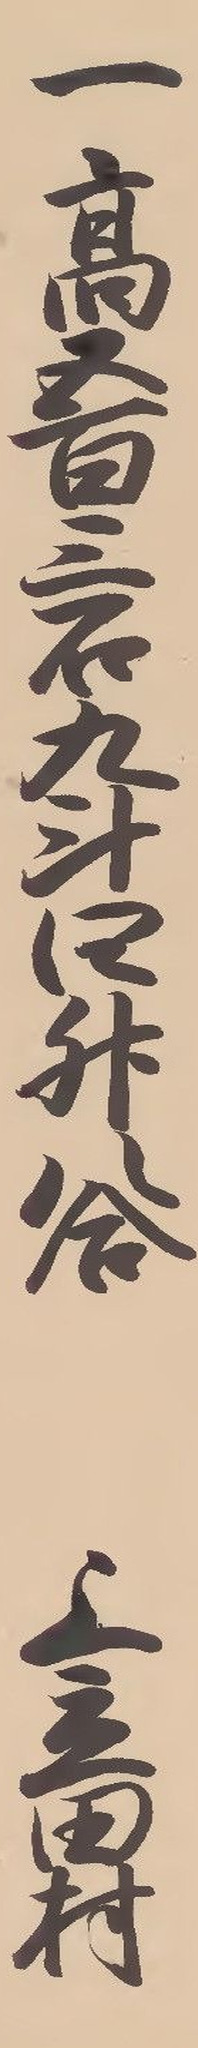一高五百三石九斗四升八合上立田村
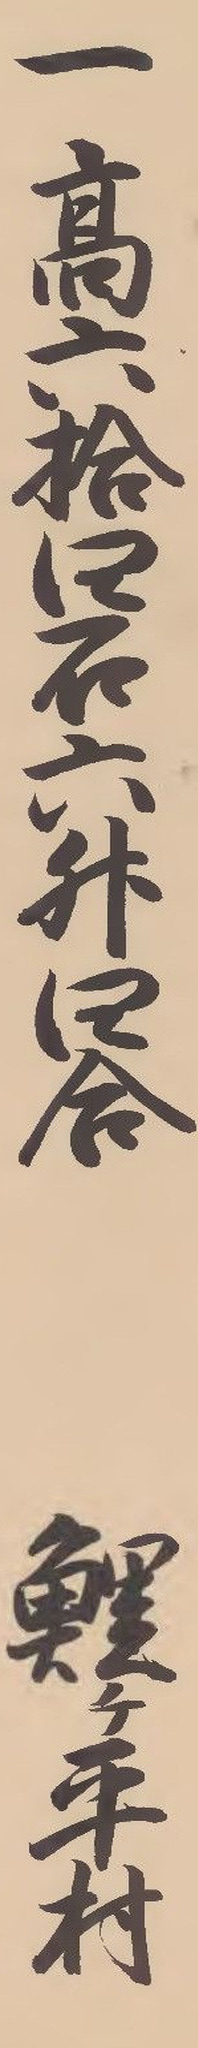一高六拾四石六升四合鯉ヶ平村
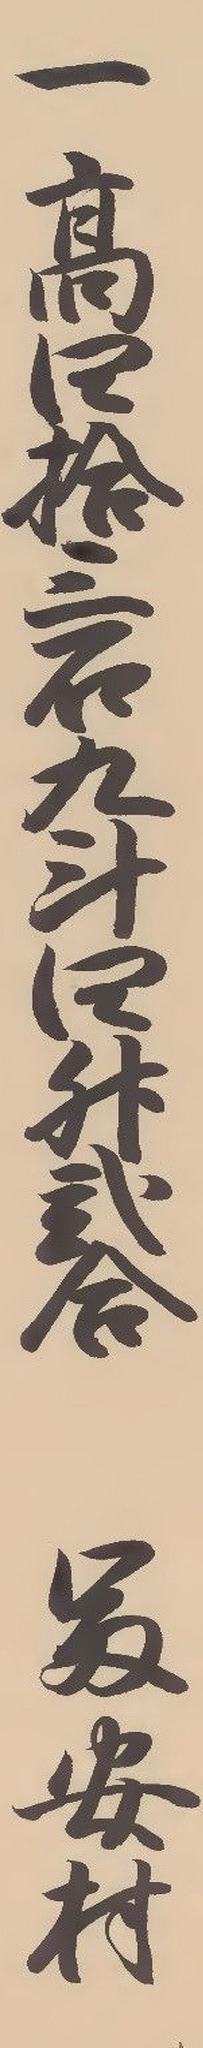一高四拾三石九斗四升弐合富安村
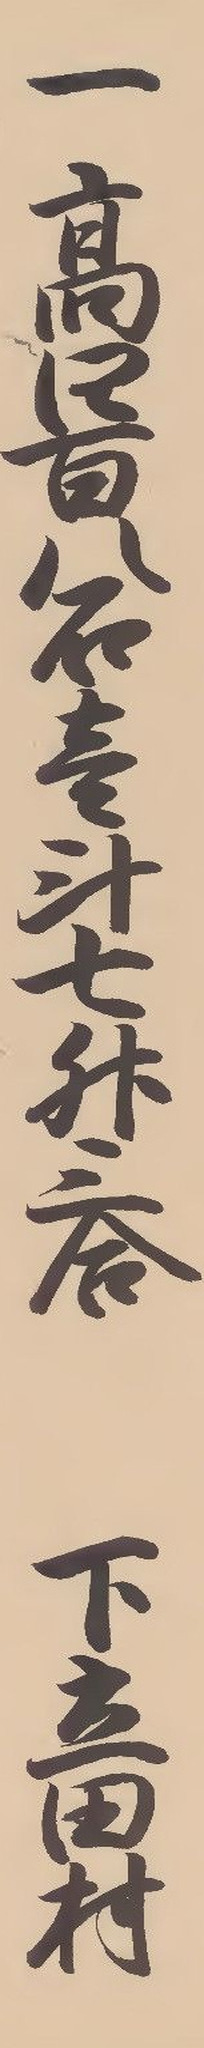一高四百八石壱斗七升三合下立田村
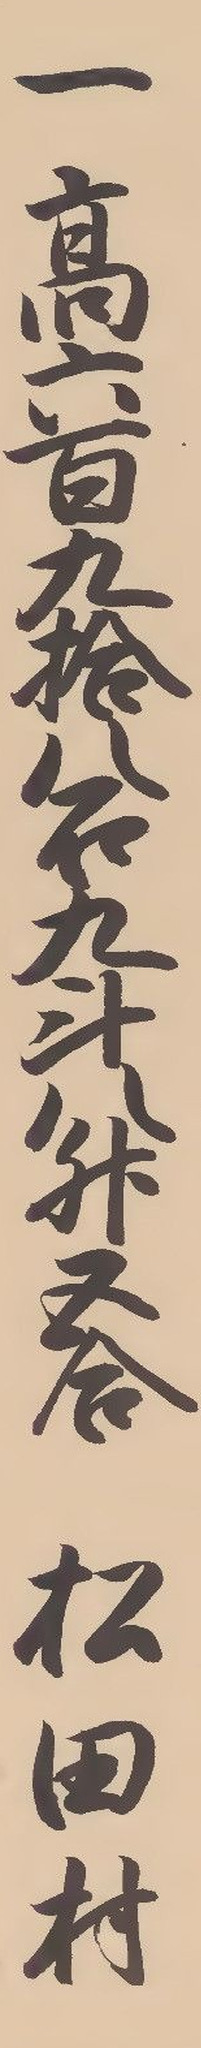一高六百九拾八石九斗八升五合松田村

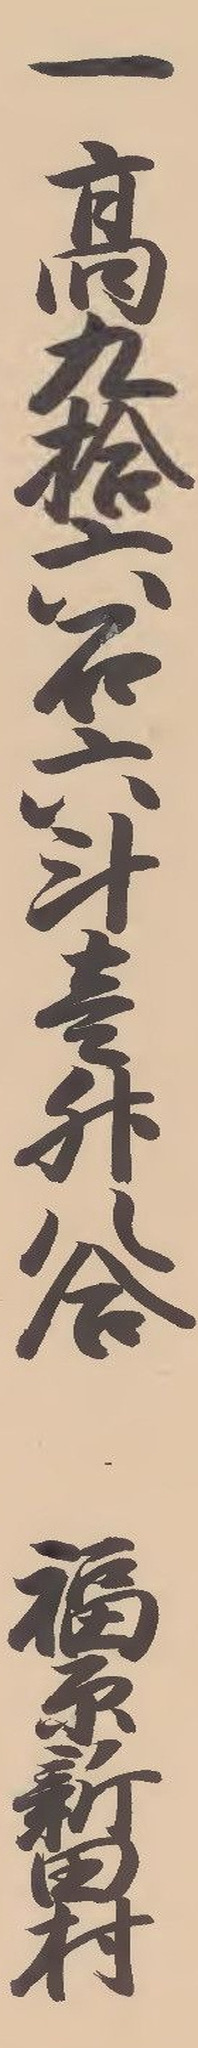一高九拾六石六斗壱升八合福原新田村
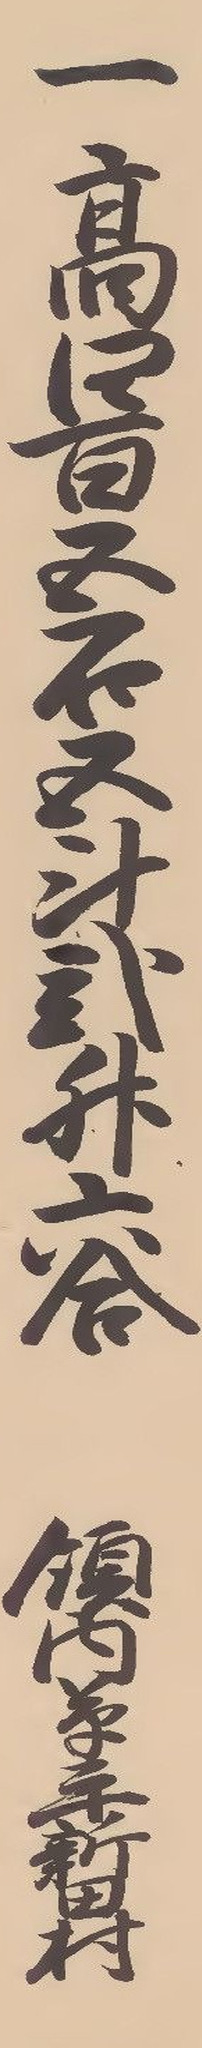一高四百五石五斗弐升六合領内草平新田村
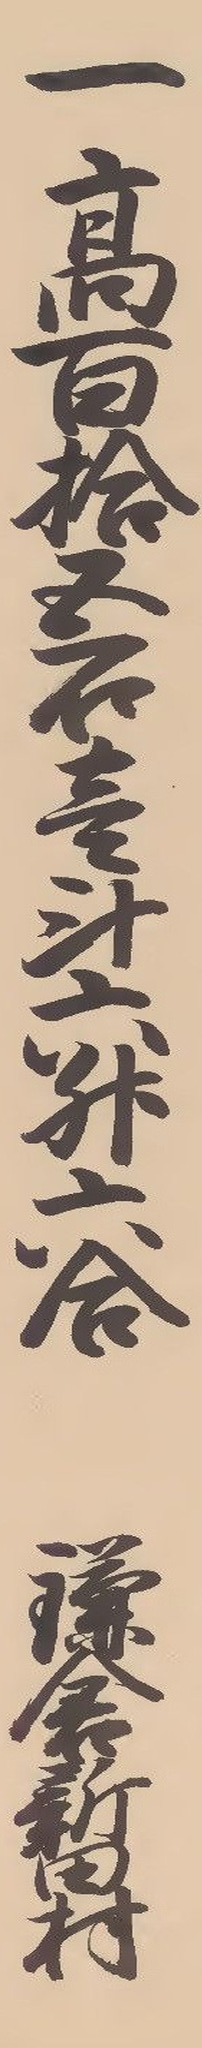一高百拾五石壱斗六升六合鎌倉新田村
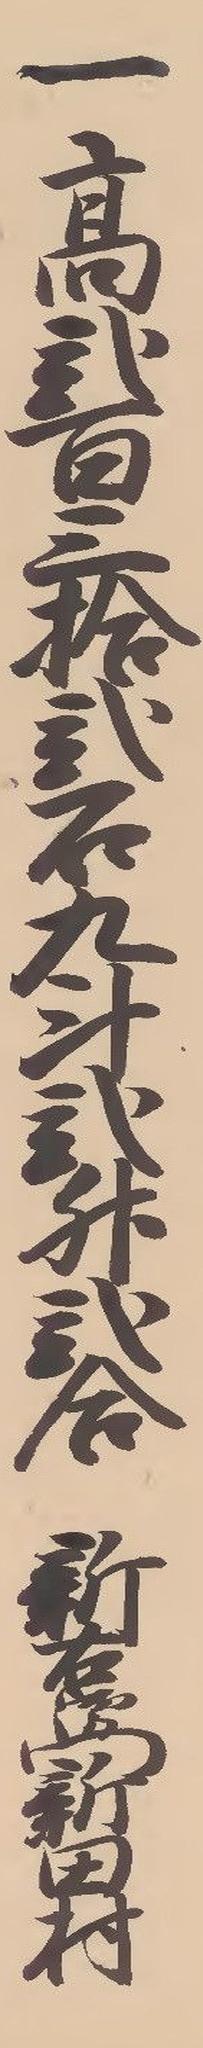一高弐百三拾弐石九斗弐升弐合新右衛門新田村
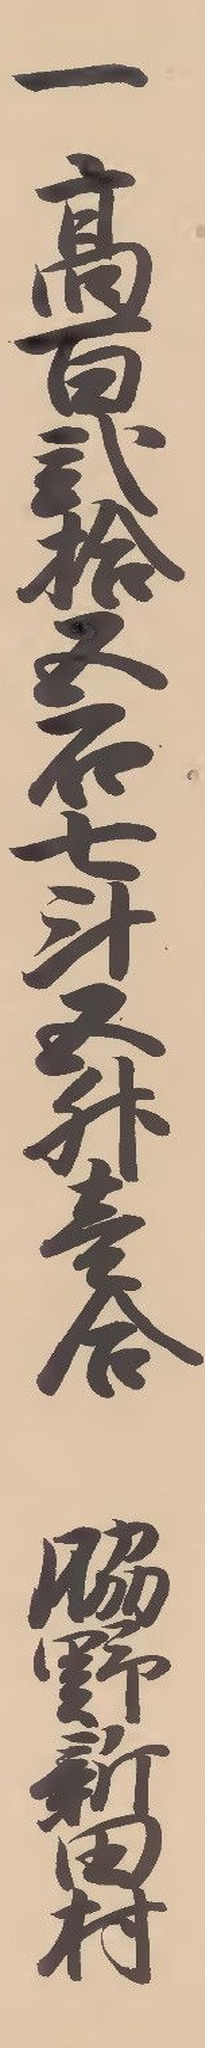一高百弐拾五石七斗五升壱合脇野新田村
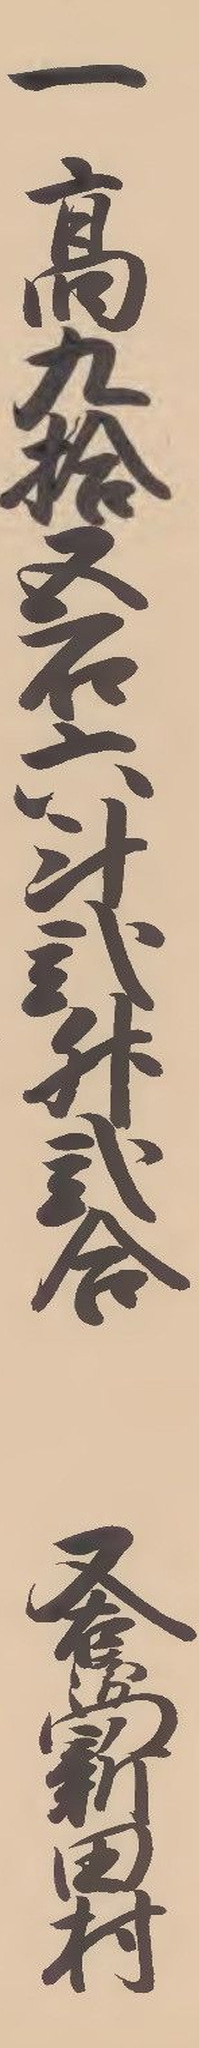一高九拾五石六斗弐升弐合又右衛門新田村
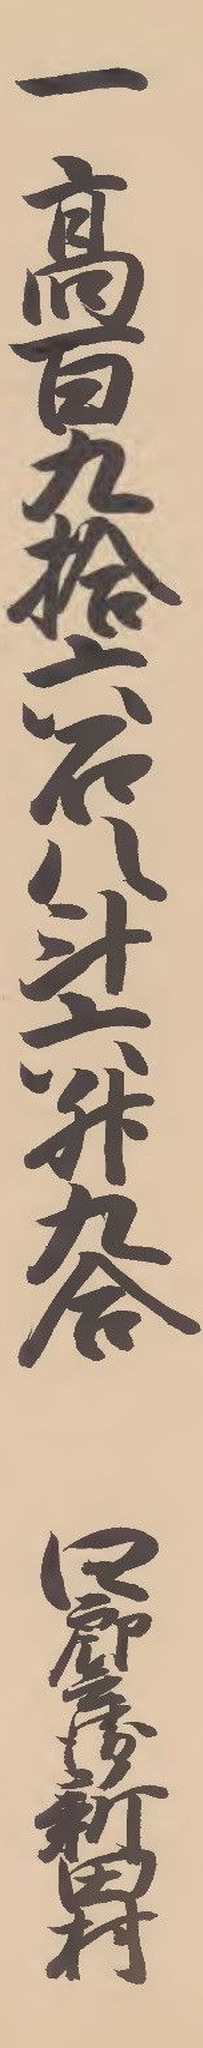一高百九拾六石八斗六升九合四郎兵衛新田村
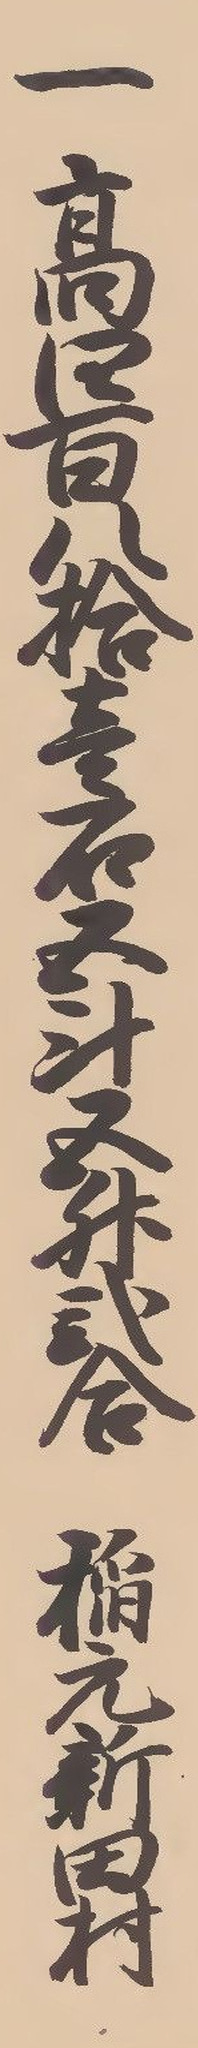一高四百八拾壱石五斗五升弐合稲元新田村

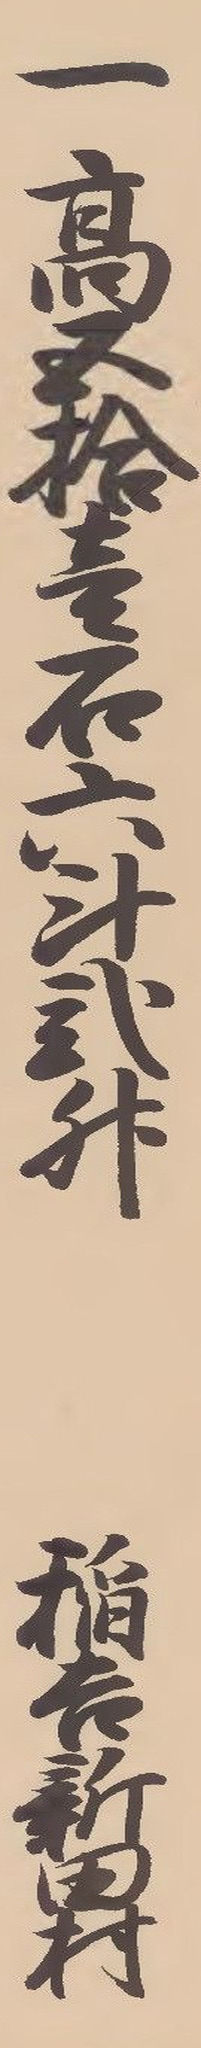一高五拾壱石六斗弐升稲吉新田村
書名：尾張国郷帳
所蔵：国立公文書館 National Archives of Japan
